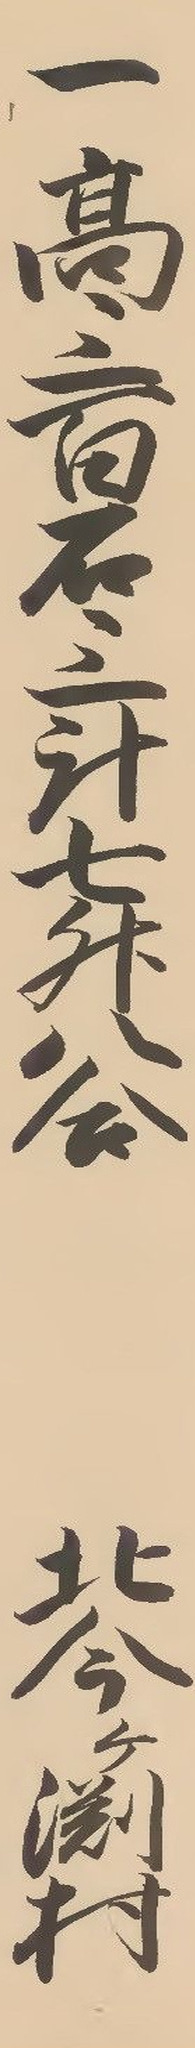一高三百石三斗七升八合北今ヶ渕村
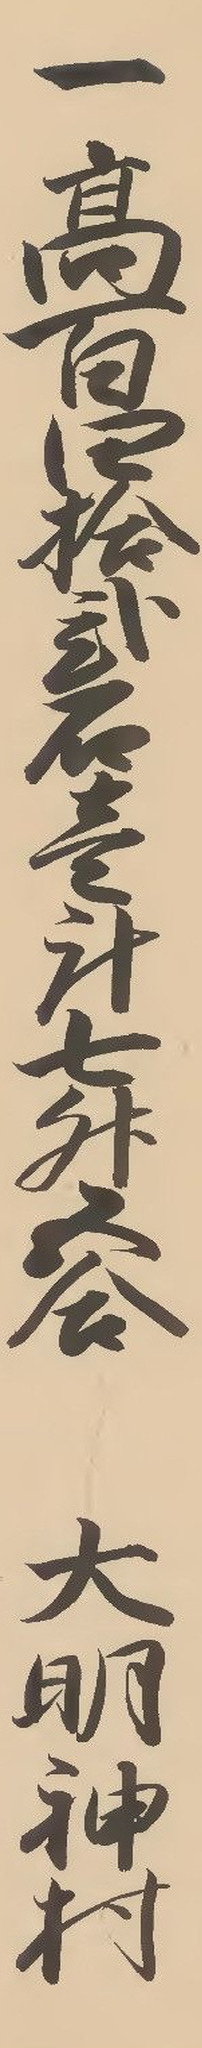一高百四拾弐石壱斗七升五合大明神村
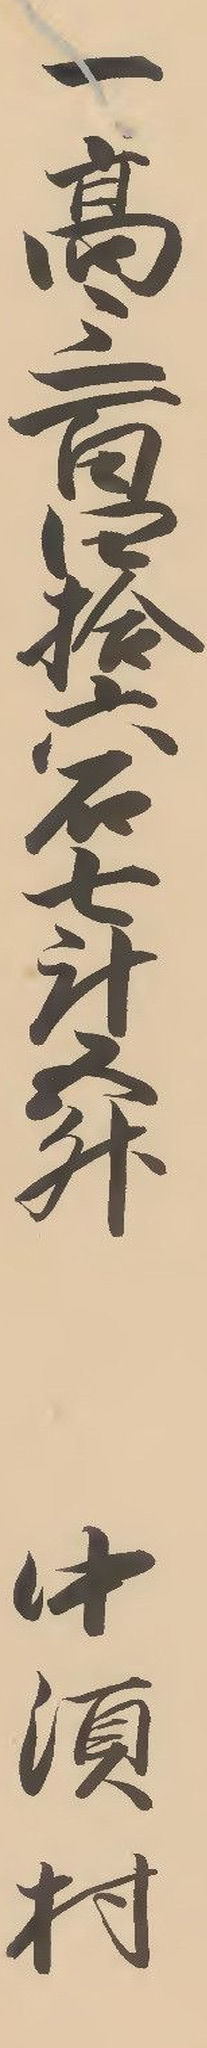一高三百四拾六石七斗五升中須村

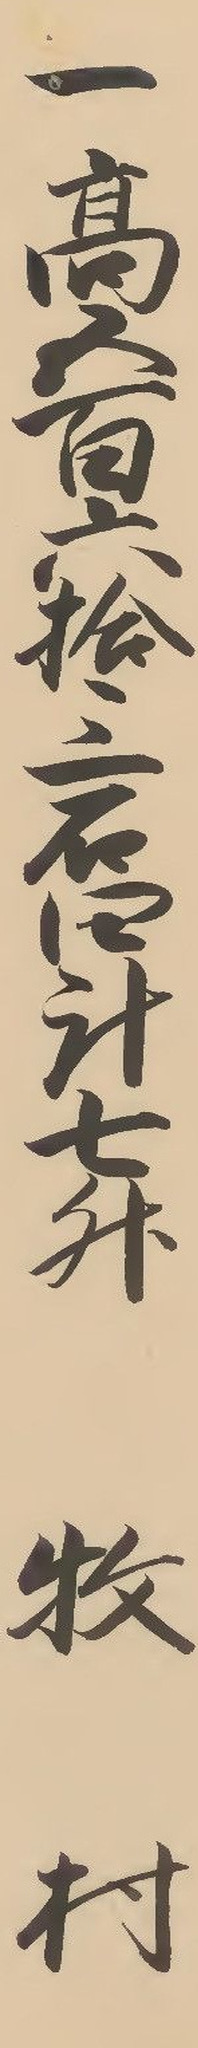一高五百六拾三石四斗七升牧村
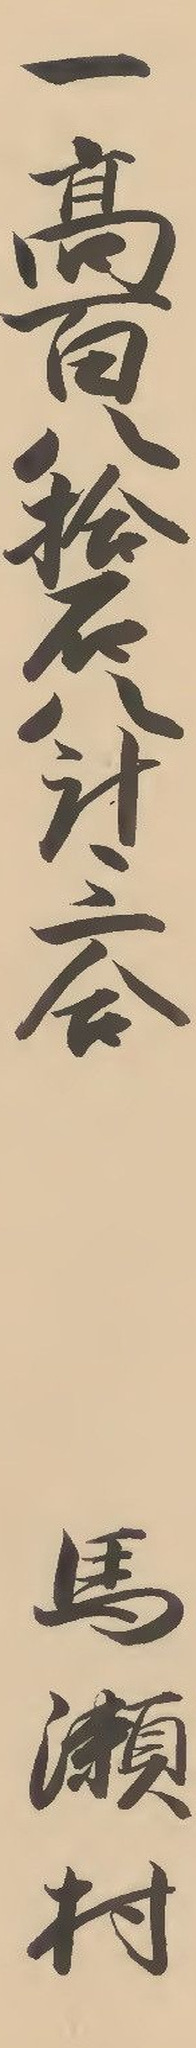一高百八拾石八斗三合馬瀬村
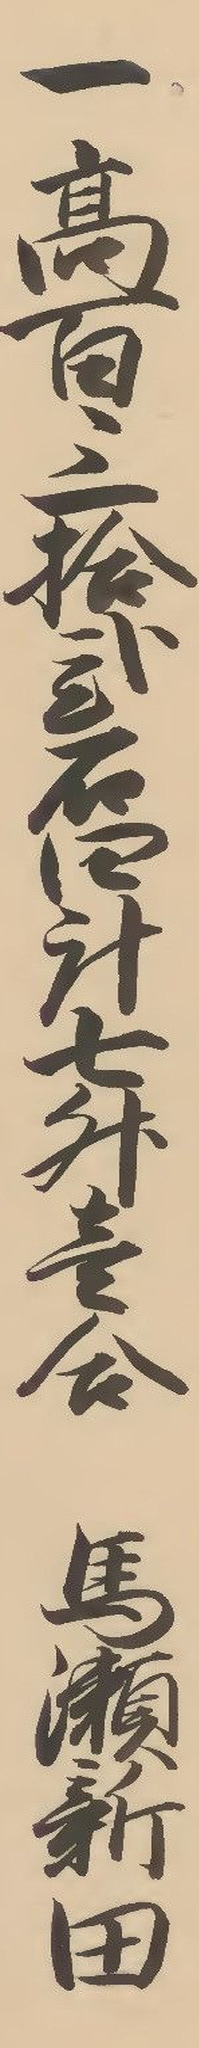一高百三拾弐石四斗七升壱合馬瀬新田
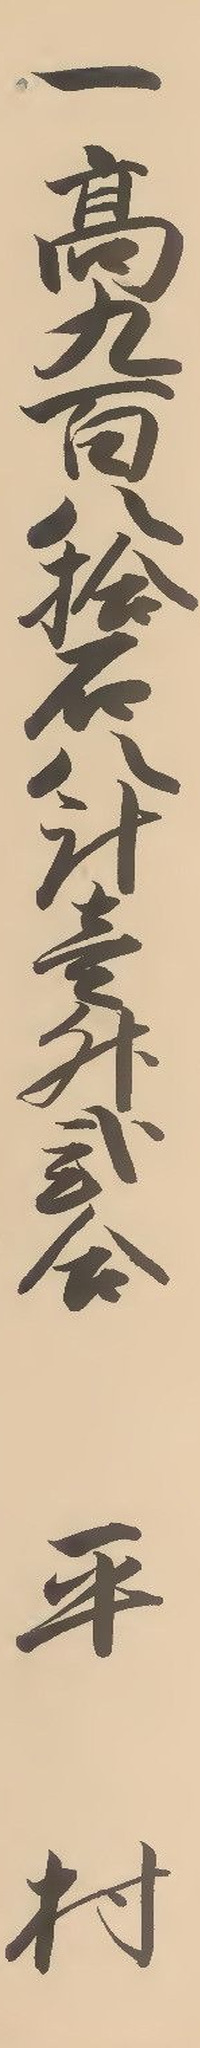一高九百八拾石八斗壱升弐合平村
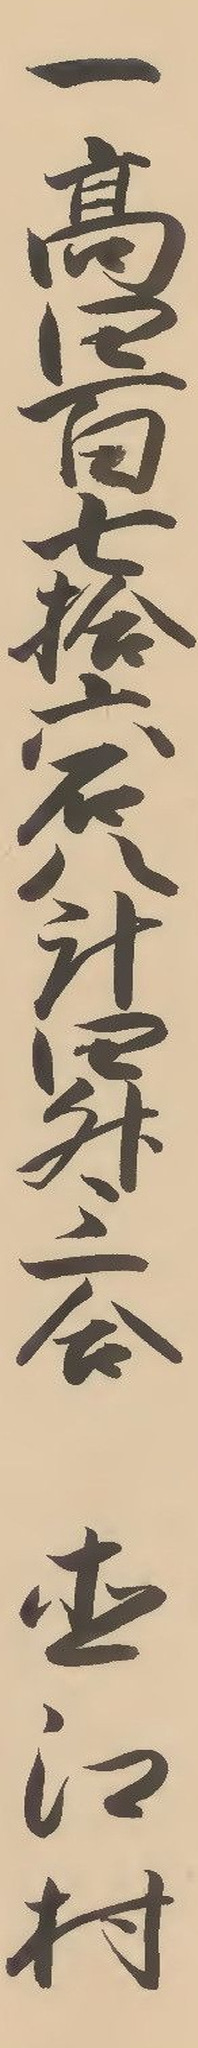一高四百七拾六石八斗四升三合直江村
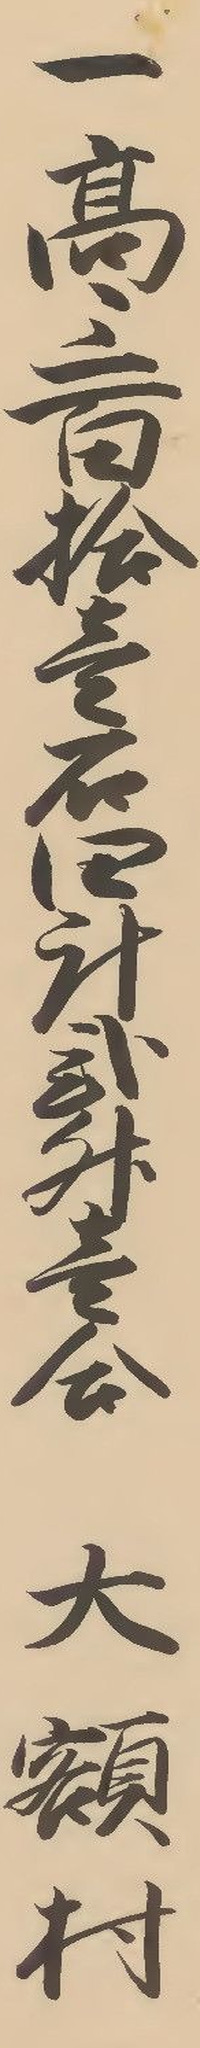一高三百拾壱石四斗弐升壱合大額村
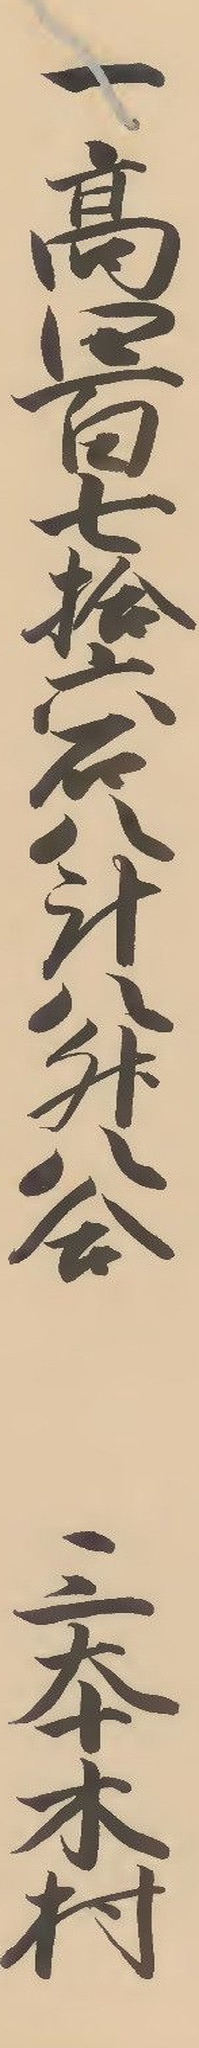一高四百七拾六石八斗八升八合三本木村

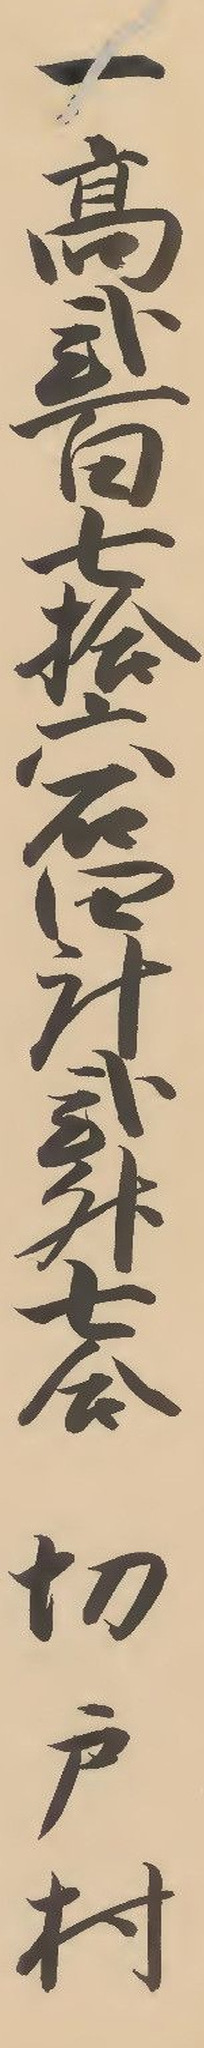一高弐百七拾六石四斗弐升七合切戸村
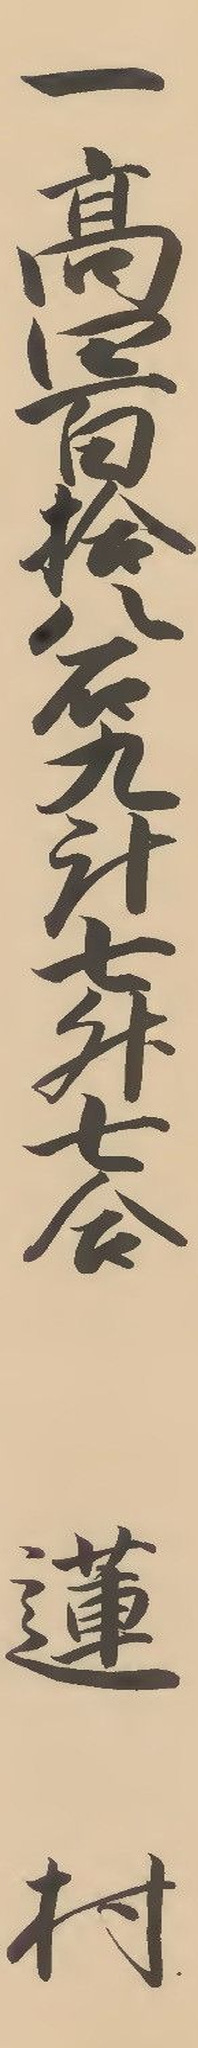一高四百拾八石九斗七升七合蓮村
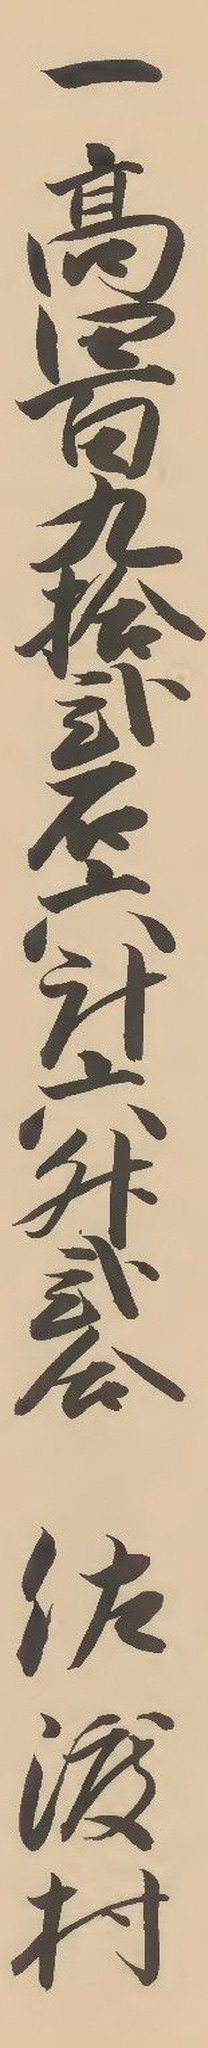一高四百九拾弐石六斗六升弐合佐渡村
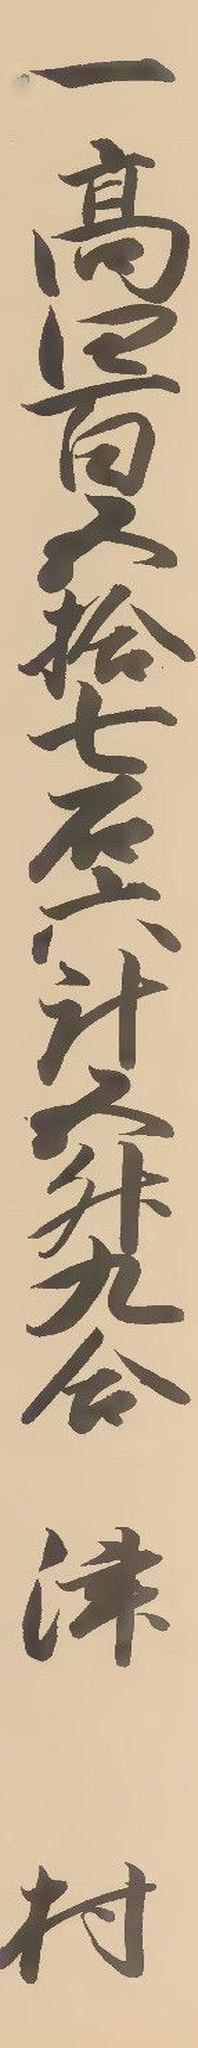一高四百五拾七石六斗五升九合津村
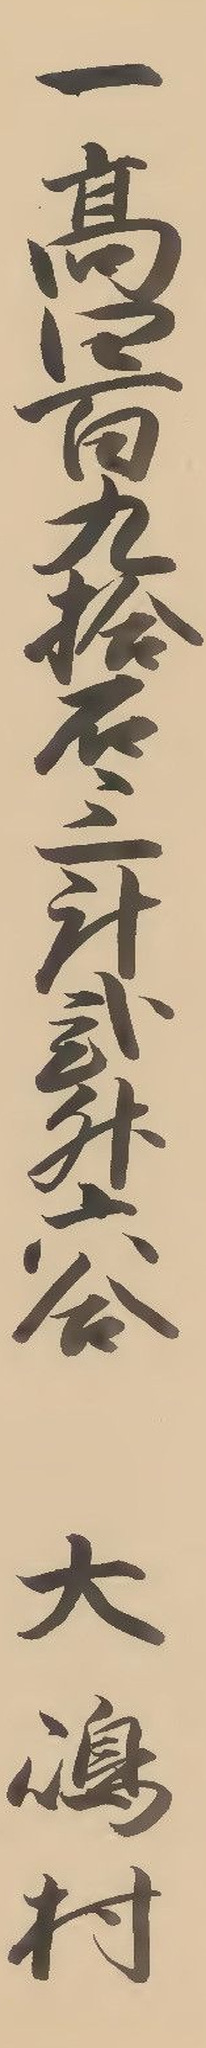一高四百九拾石三斗弐升六合大島村
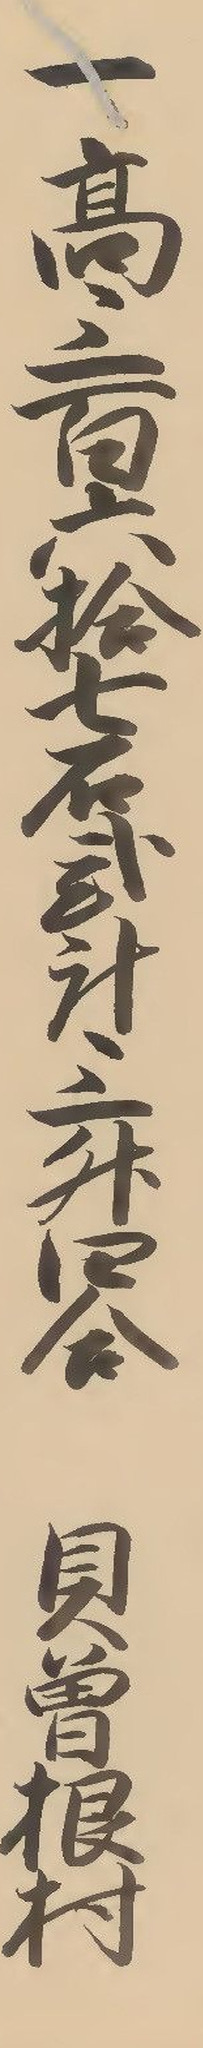一高三百六拾七石弐斗三升四合貝曽根村
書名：美濃国郷帳
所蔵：国立公文書館 National Archives of Japan
